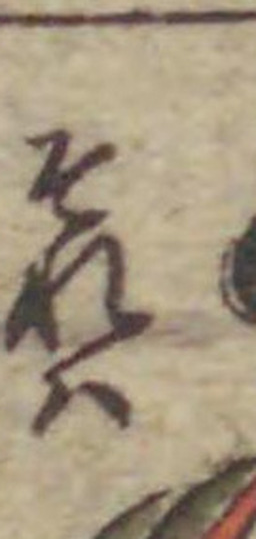それは
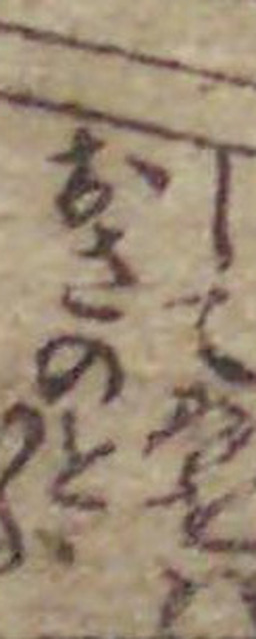おさのと

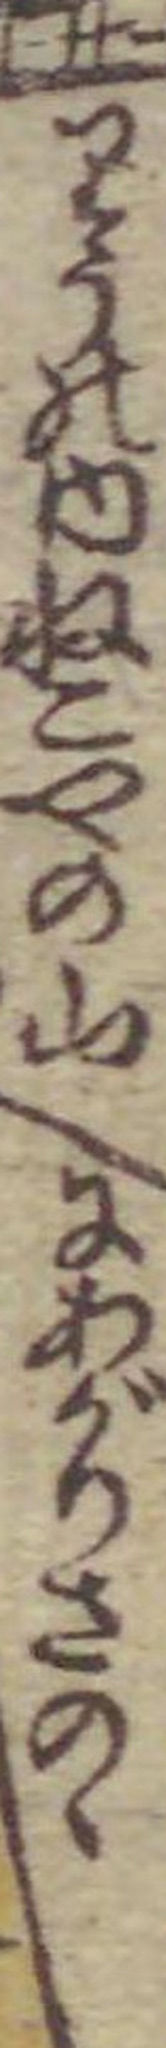りうの内ねこやの山にあがりさのゝ
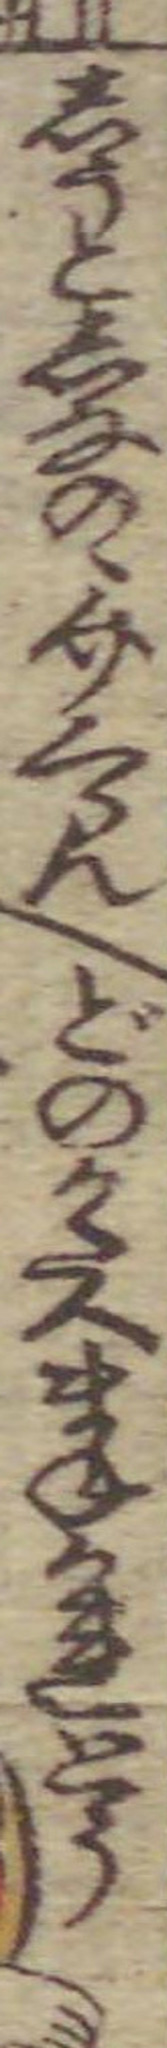しうとしなのゝ介くらんどのかたへまねかれとう
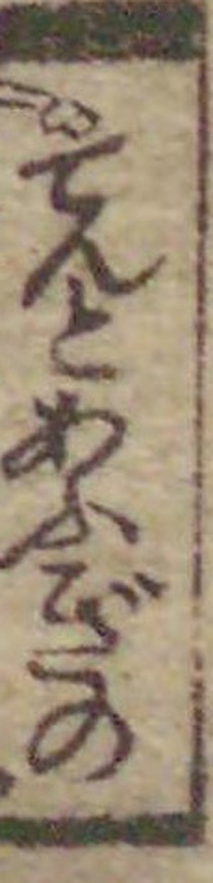てんとあふぎの
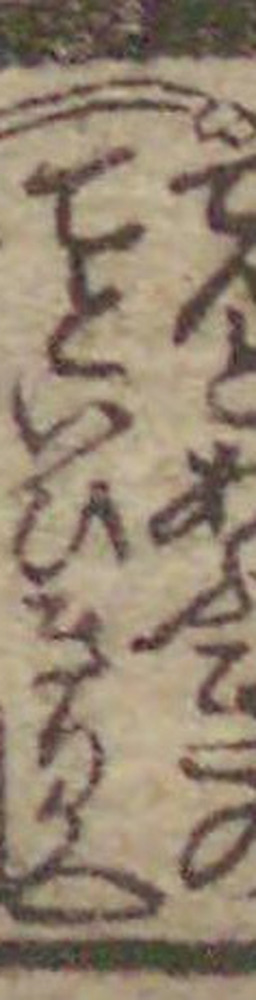てといひきりかへし
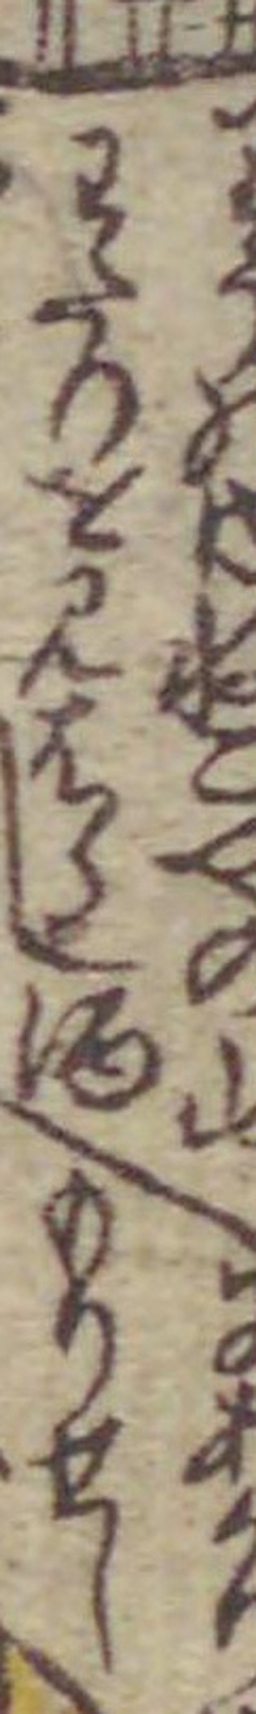わたりを見はらし酒もりせし
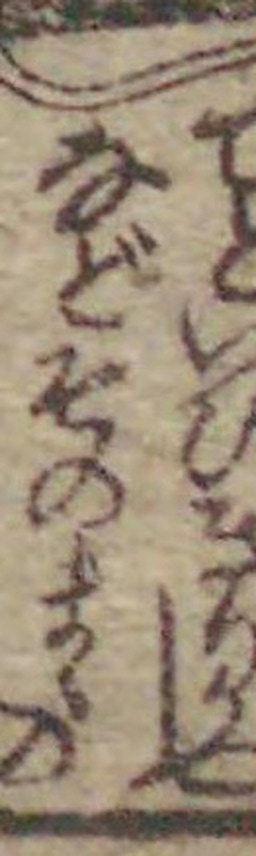などそのまゝの
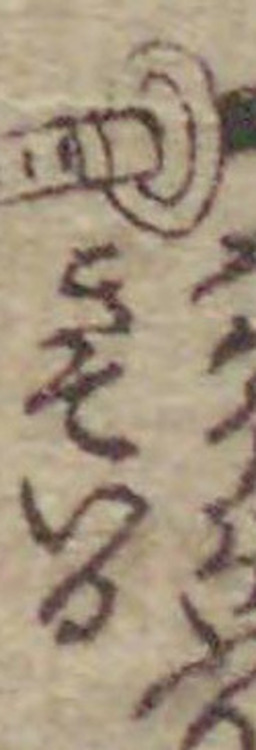きている
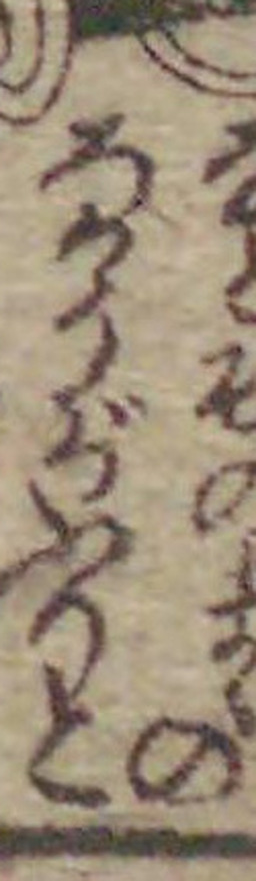ろかうがふりと
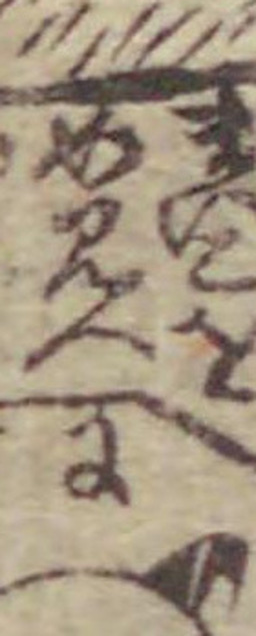め見へに
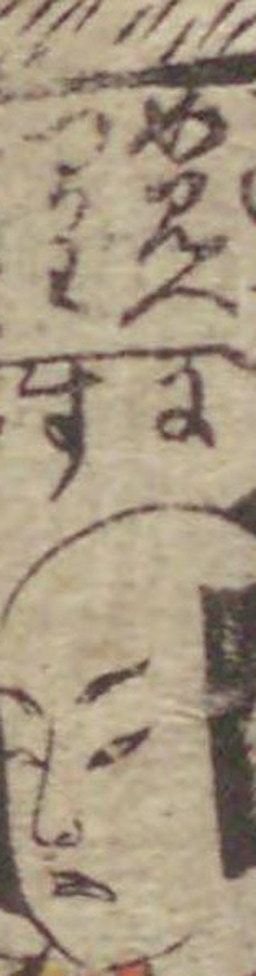つかわす
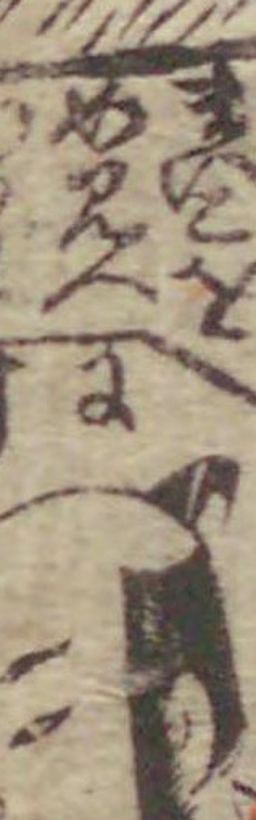め見へに
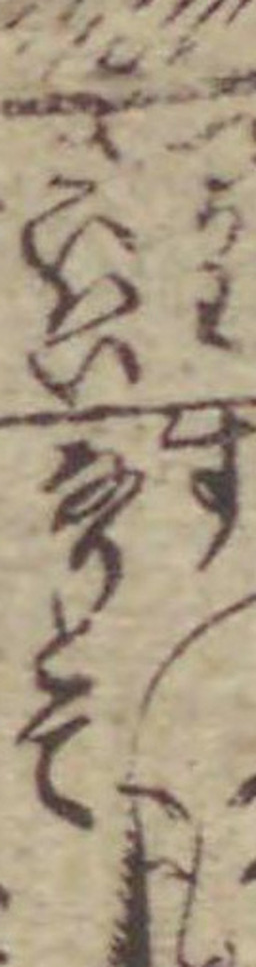さいはいなりとて
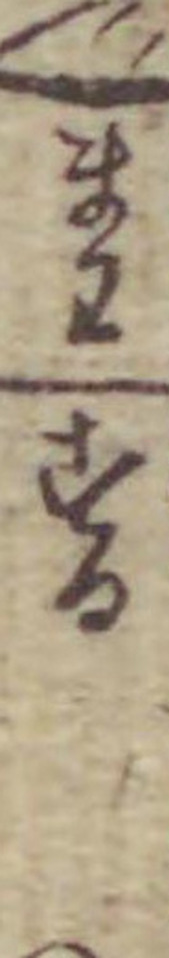まわする
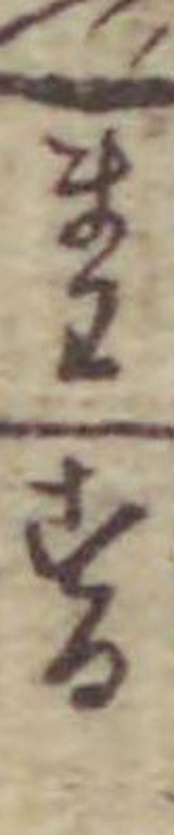まわする
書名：娜二代鉢木 5巻
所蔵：国立国会図書館 National Diet Library, JAPAN
